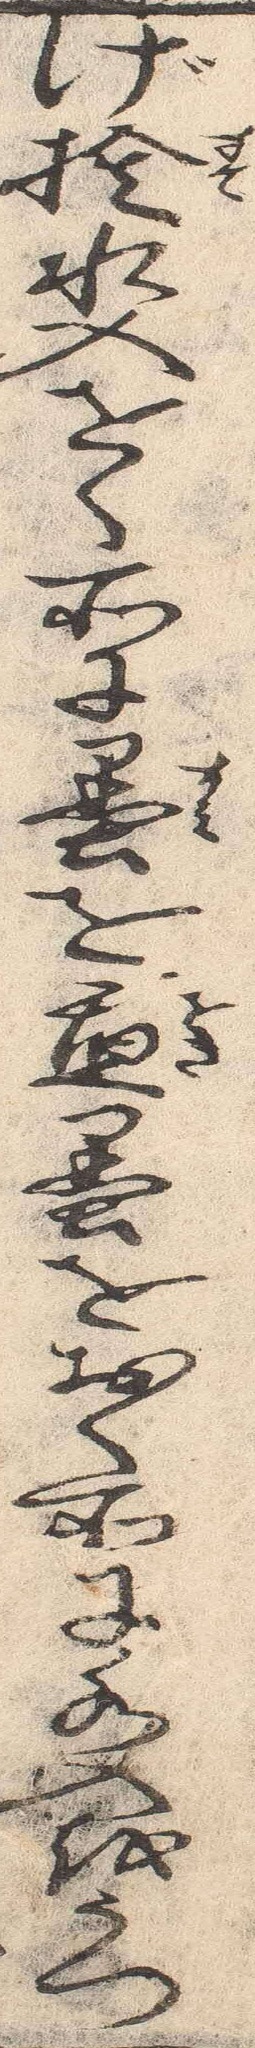げ捨水入をく所に墨を置墨をおく所に水入をうつ
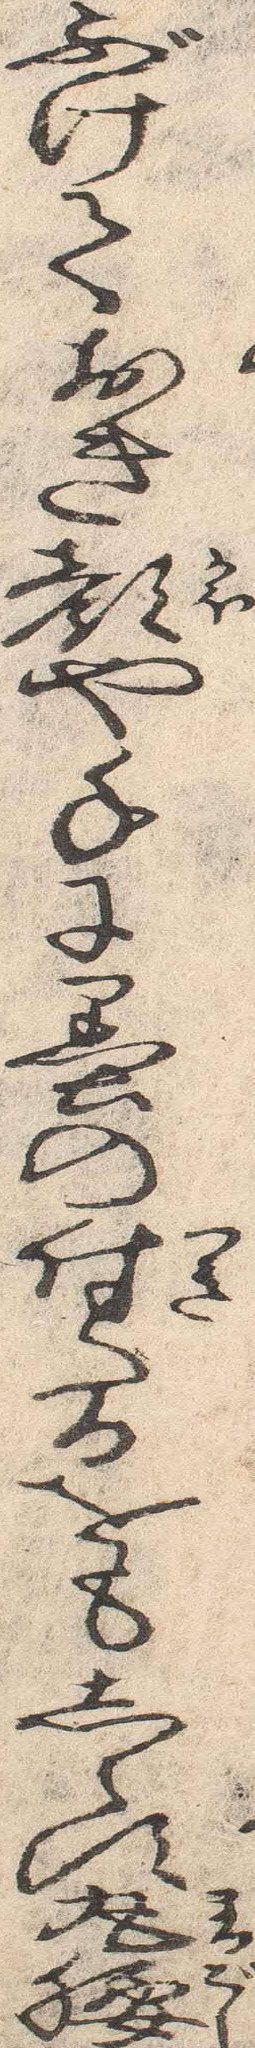ぶけておき顔や手に墨の付たるをもしらす丸腰
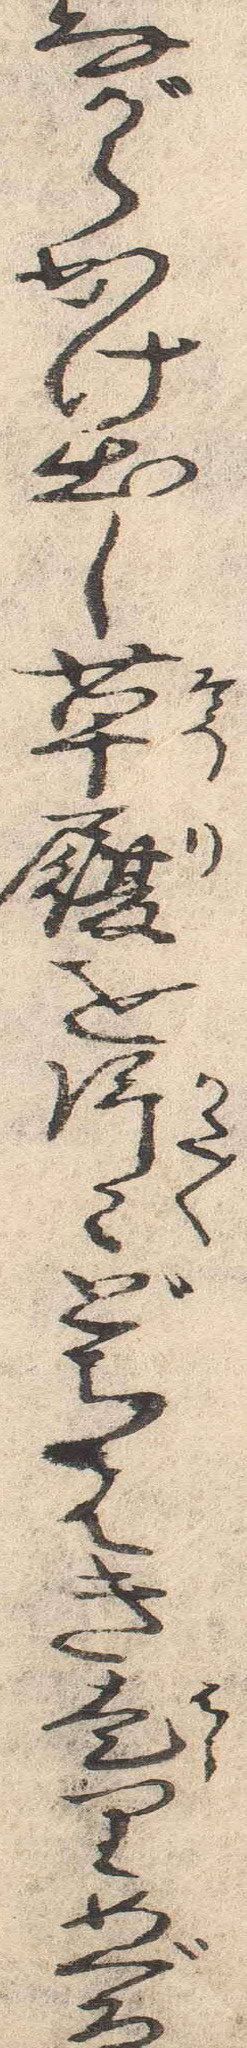ながらかけ出し草履を片々どちはき走りめぐる
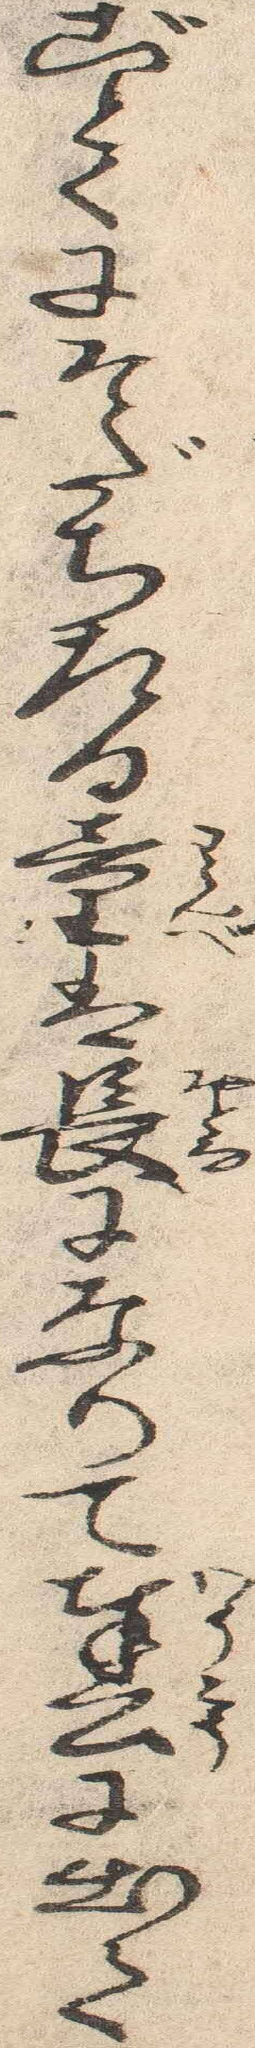ごとくにそだちたる童は長になりて奉公に出て
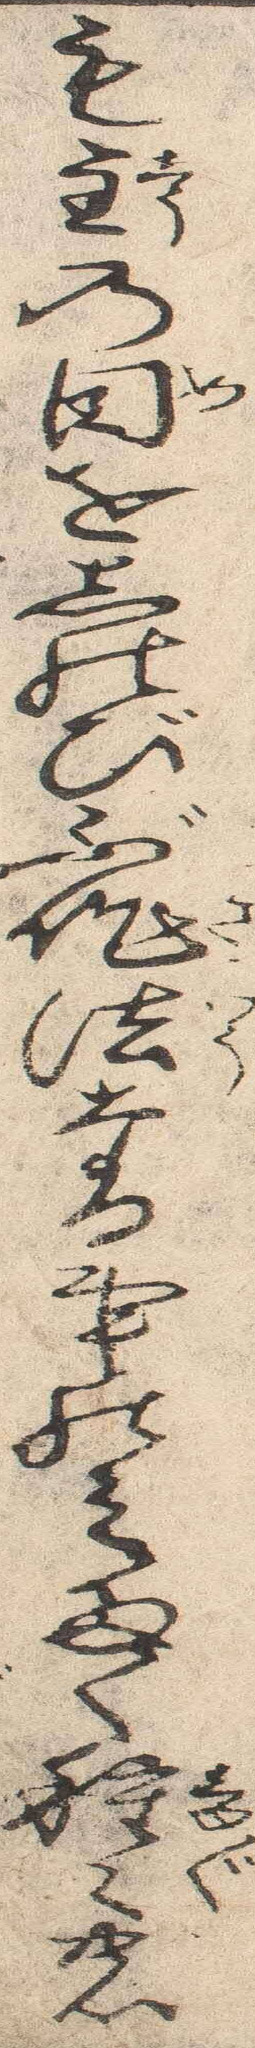も主の目をしのびぶ作法なる事のみ多く種々の
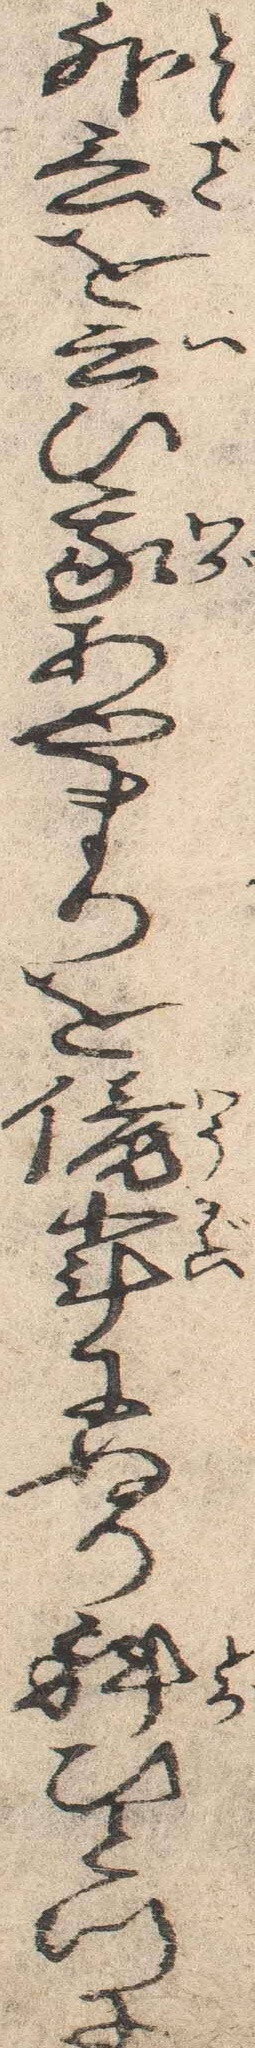外言を云ひ我あやまりを傍輩にぬり科ひとつに
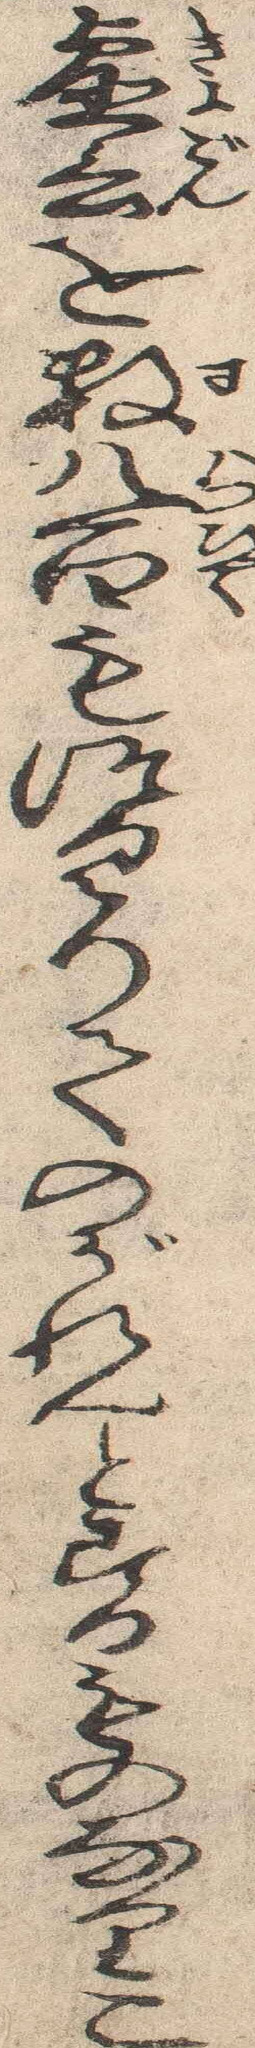虚言を数八百もつくりてのがれんとするものなりこ
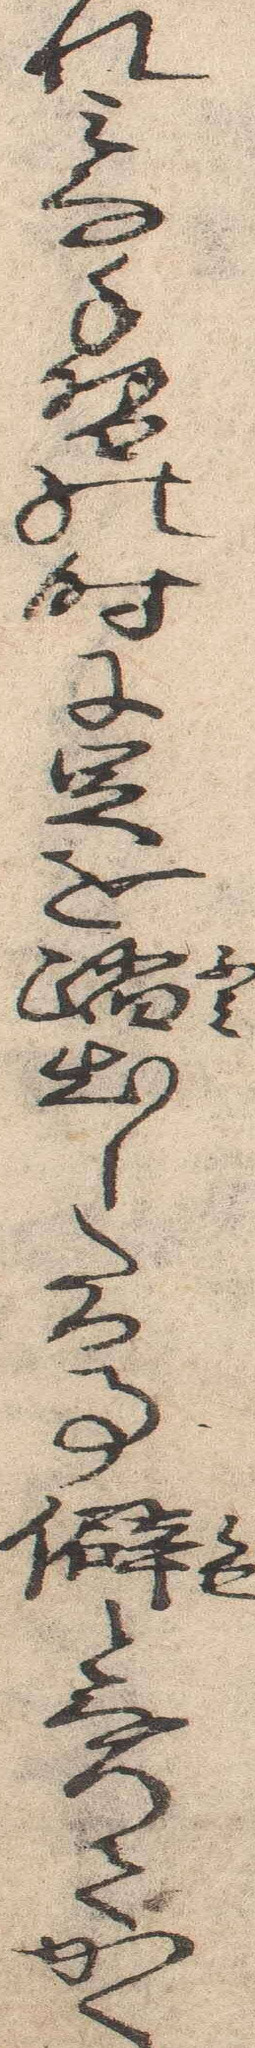れみな手習の時に足を踏出したる事僻となりてかく

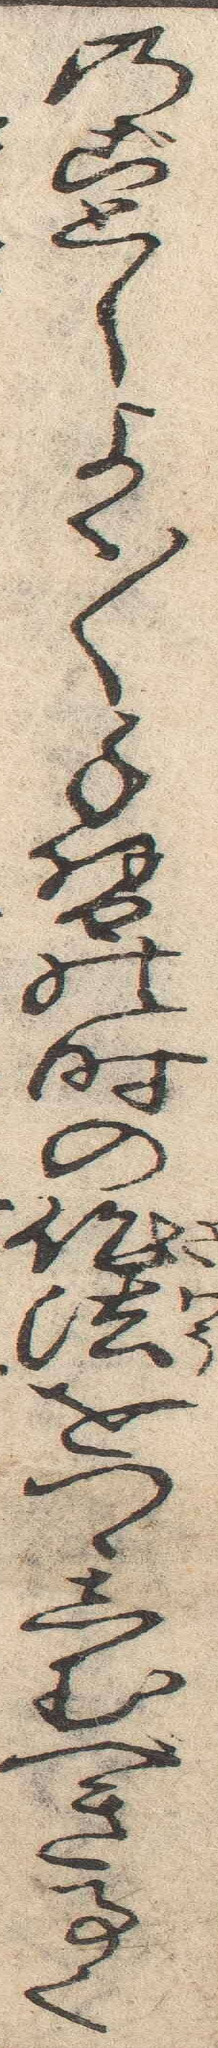のごとしよく〳〵手習の時の作法をつゝしむべき事也
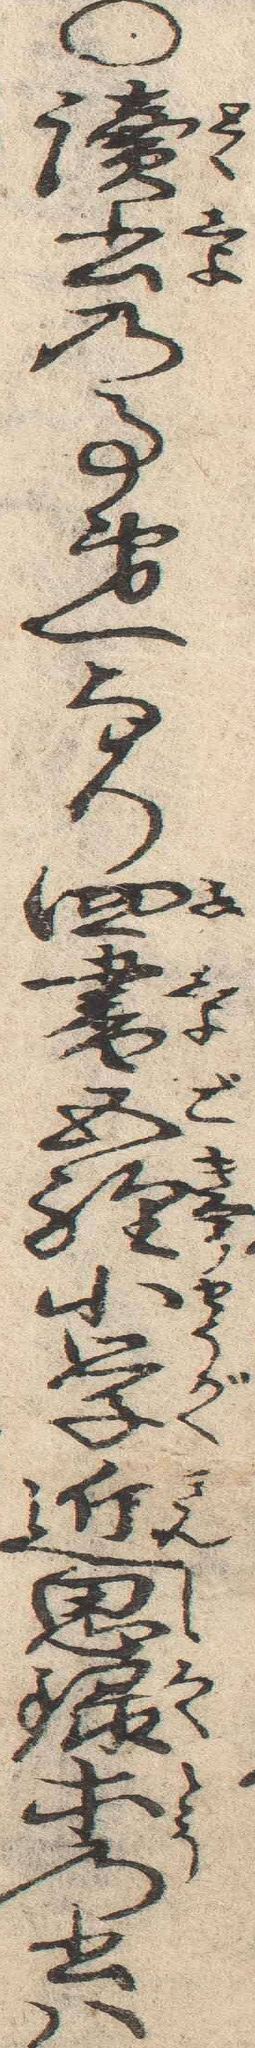○読書の事第一なり四書五経小学近思録等の書は
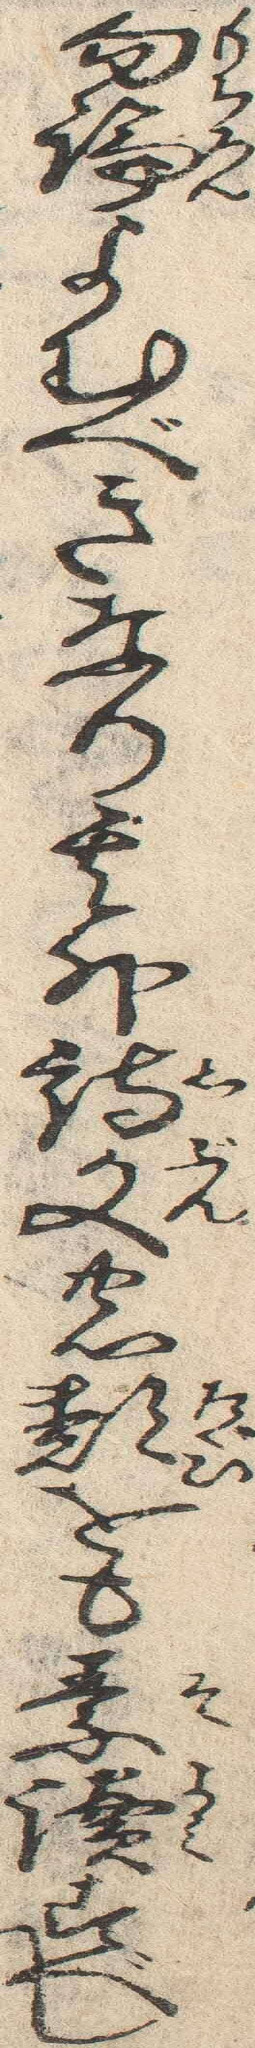勿論よむべきなり其外詩文の類をも素読すべし
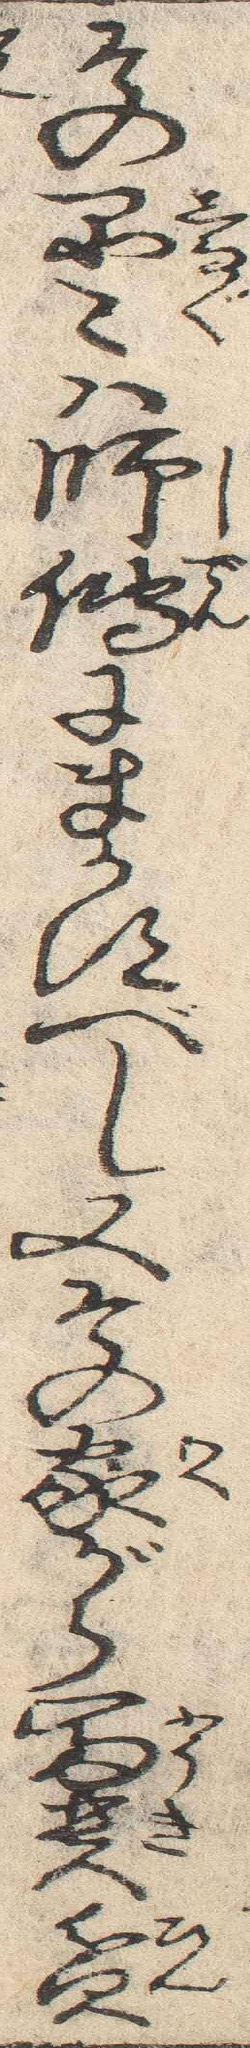その品々は師伝にまかすべし又その家がら富貴貧
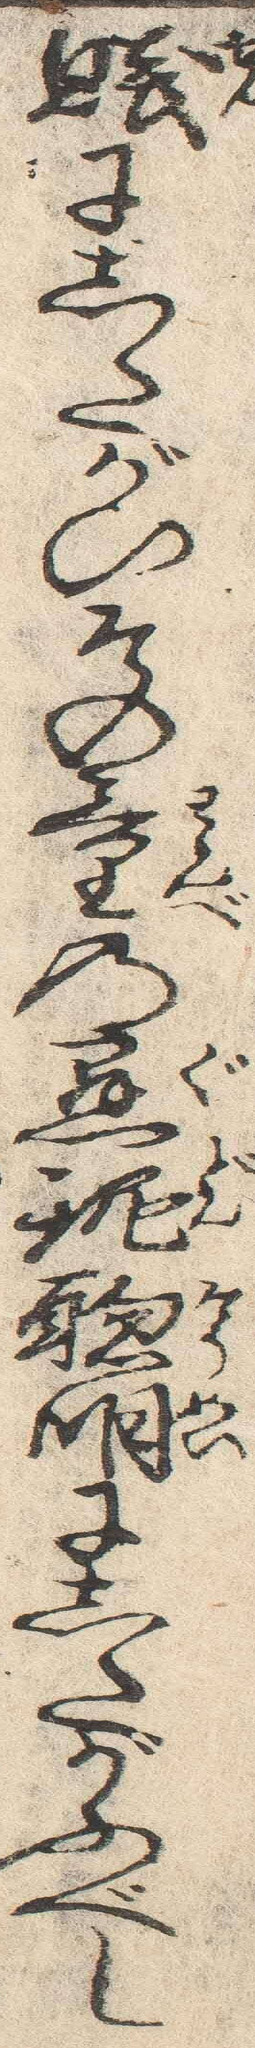賤にしたがひその童の愚鈍聡明にしたがふべし
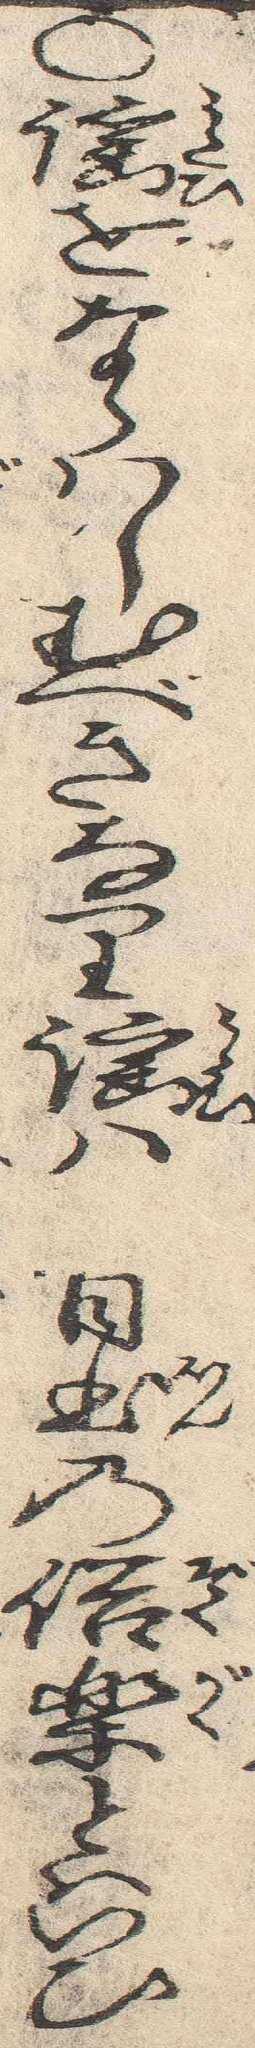○謡をならはしむべきなり謡は日本の俗楽といひ
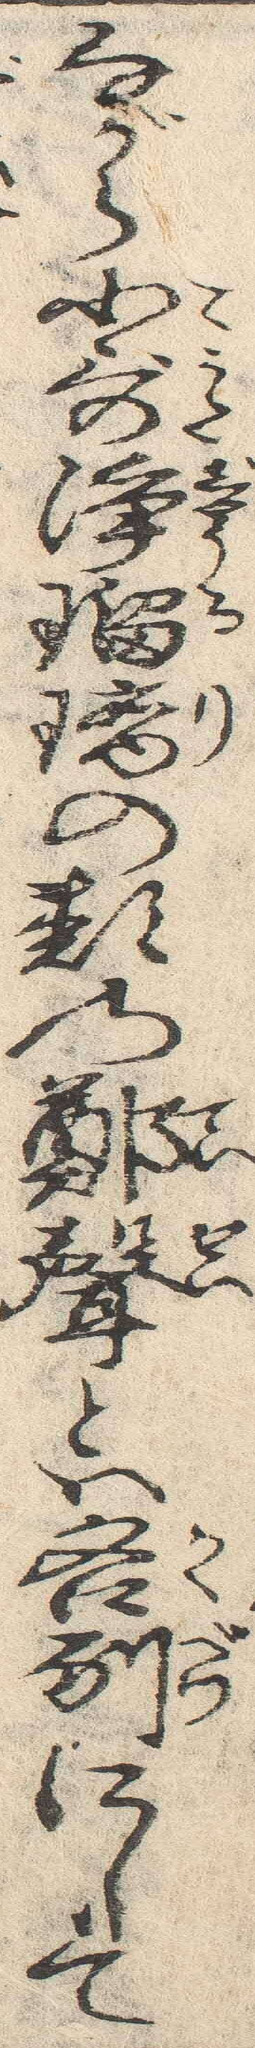ながら小哥浄瑠璃の類の鄭声とは各別にして
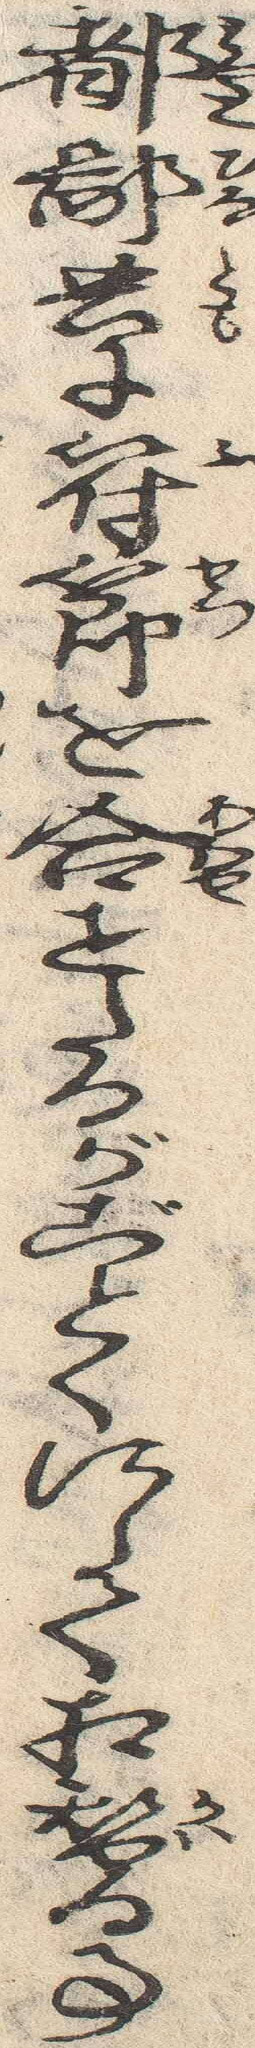都鄙共に符節を合せたるがごとくにして相替る事
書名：小児必用養育草
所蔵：東京学芸大学附属図書館 国文学研究資料館
